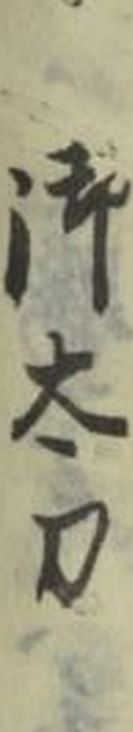御太刀
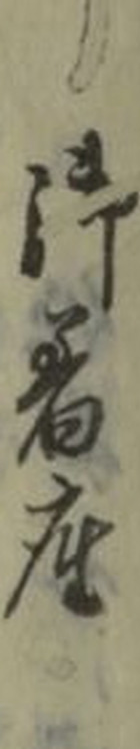御着座
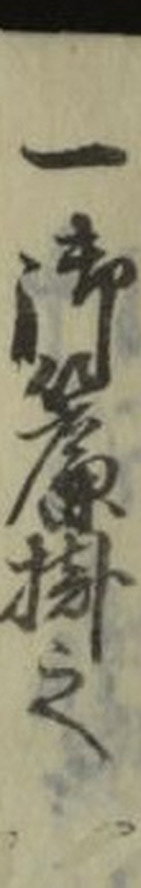一御簾掛之
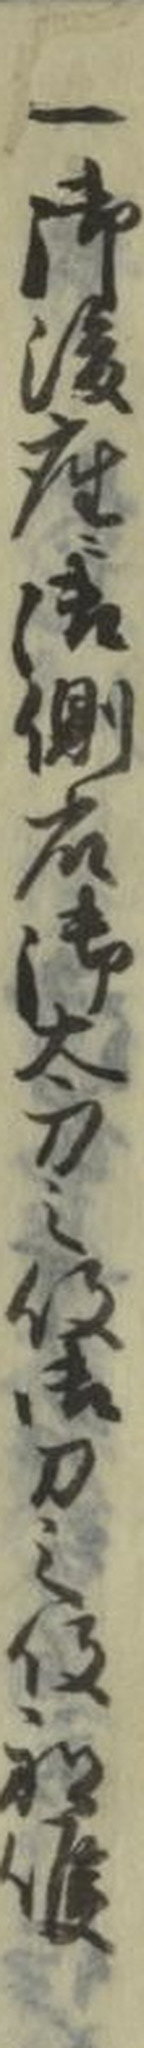一御後座に御側衆御太刀之役御刀之役控候
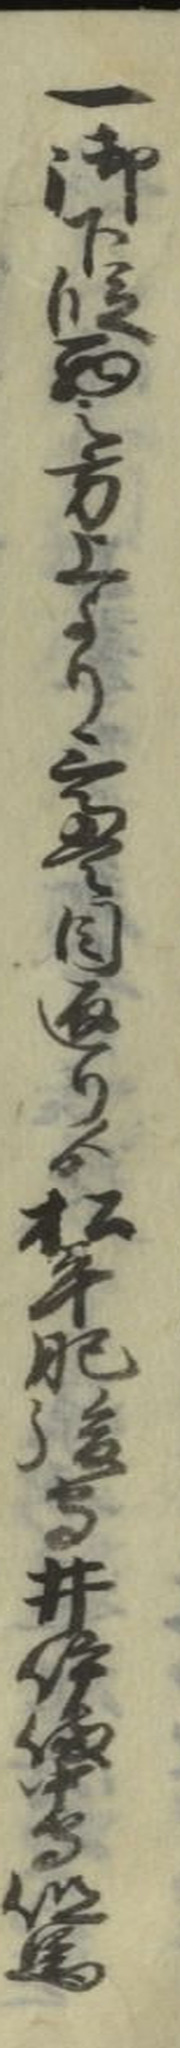一御下段西之方より三畳目通りゟ松平肥後守井伊備中守但馬
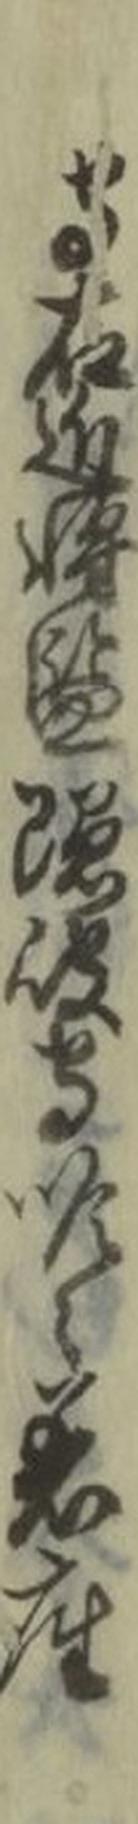守右近将監隠岐守順々着座
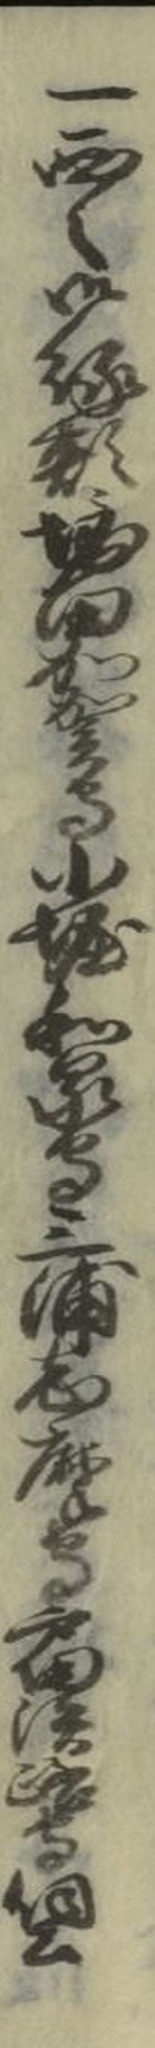一西之御縁類に堀田加賀守小堀和泉守三浦志摩守戸田淡路守伺候
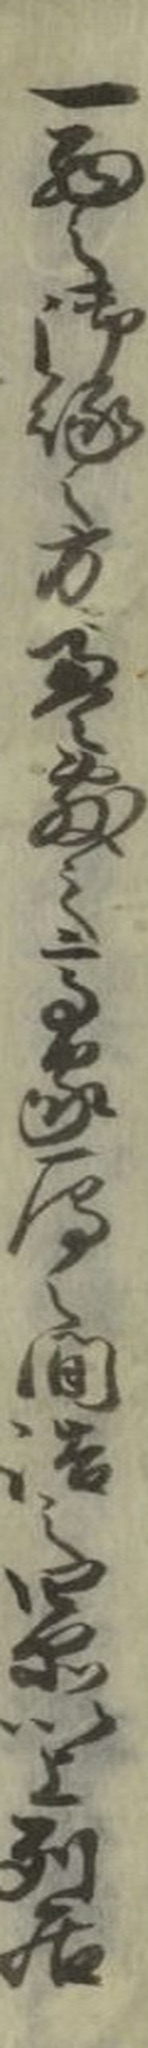一西之御縁之方畳敷之高家雁之間詰之四品以上列居
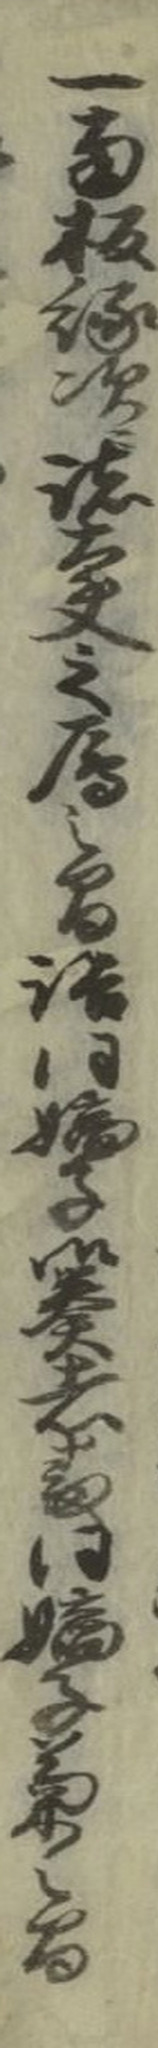一南板縁次に諸大夫之雁之間詰同嫡子御奏者番同嫡子菊之間
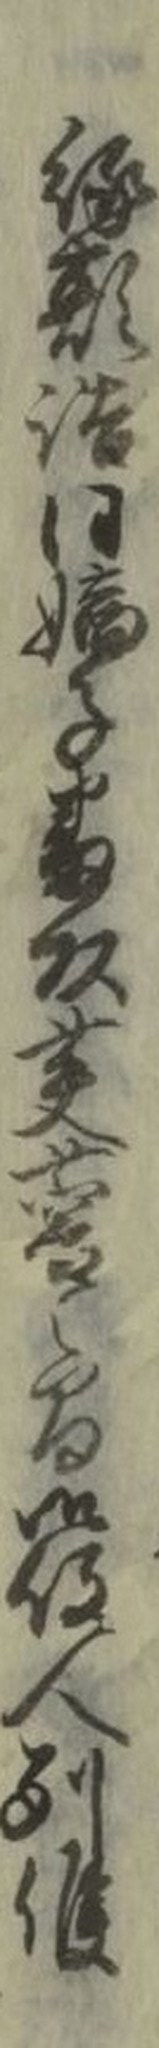縁類詰同嫡子番頭芙蓉之間御役人列候
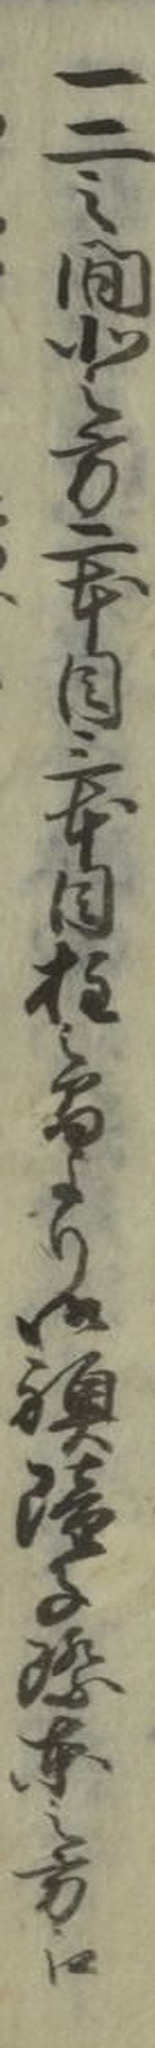一ニ之間北之方二本目三本目柱之間より御襖障子際東之方え
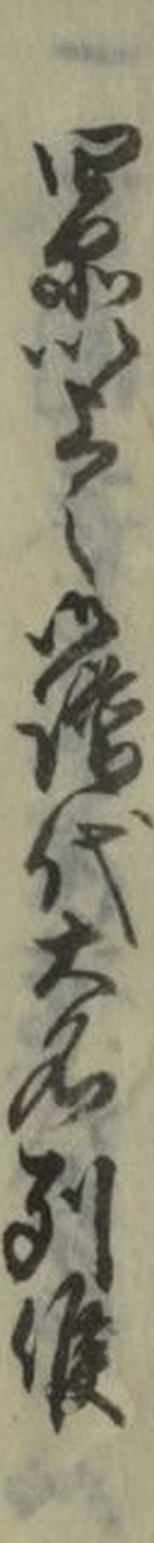四品以上之御譜代大名列候

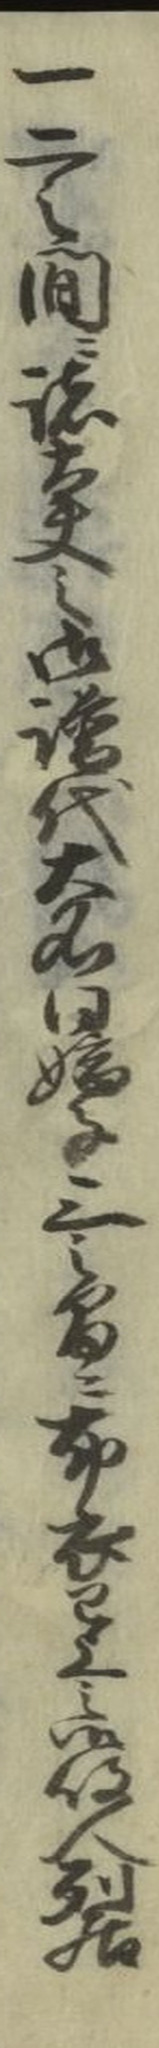一ニ之間に諸大夫之御譜代大名同嫡子三之間に布衣已上之御役人列居
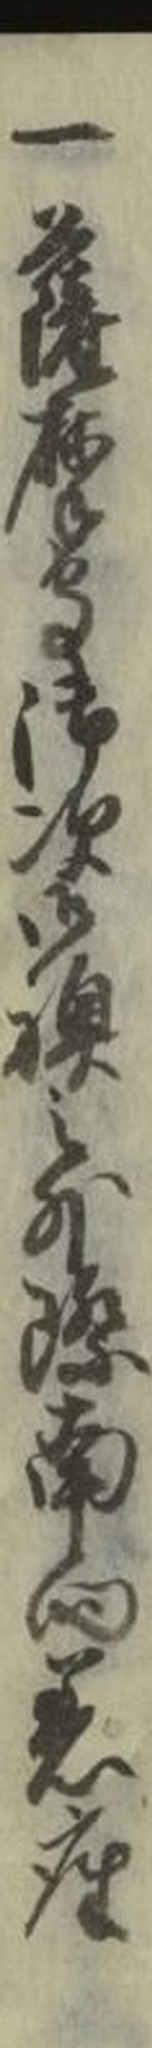一薩摩守御次御襖之外際南向着座
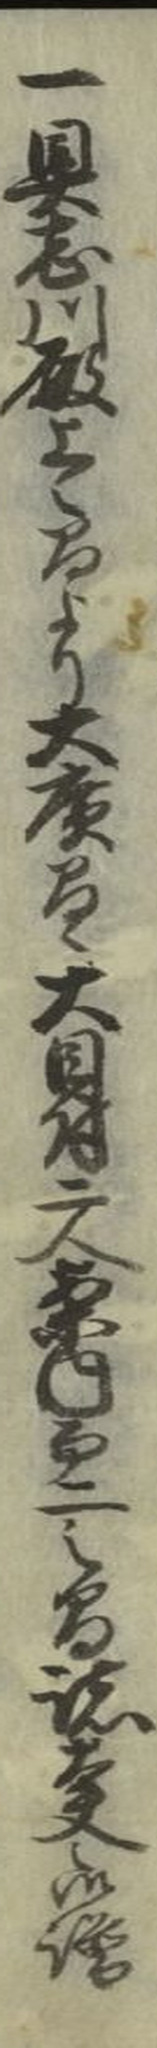一具志川殿上之間より大広間へ大目付二人案内而二之間諸大夫之御譜
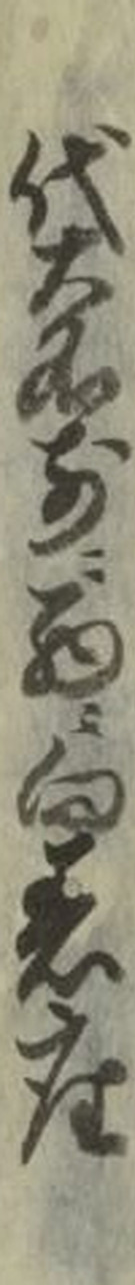代大名前に西に向着座
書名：琉球人来朝之記
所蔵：University of the Ryukyus Library
